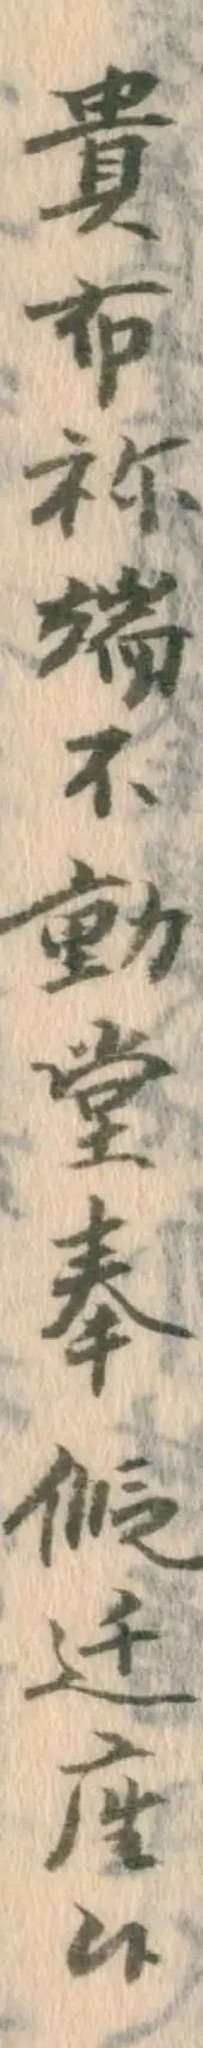貴布祢端不動堂奉仮迁座候
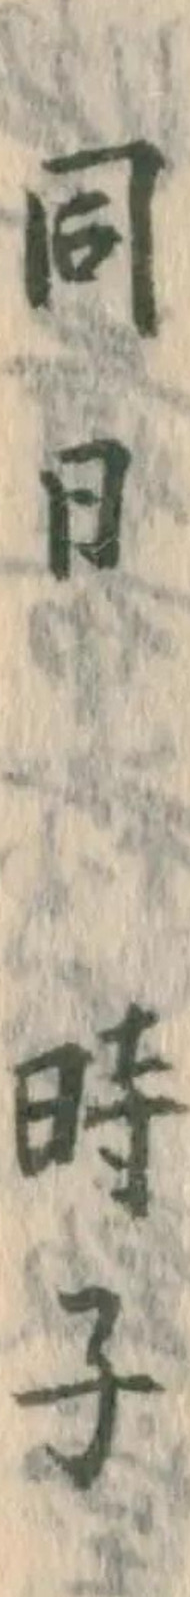同日時子
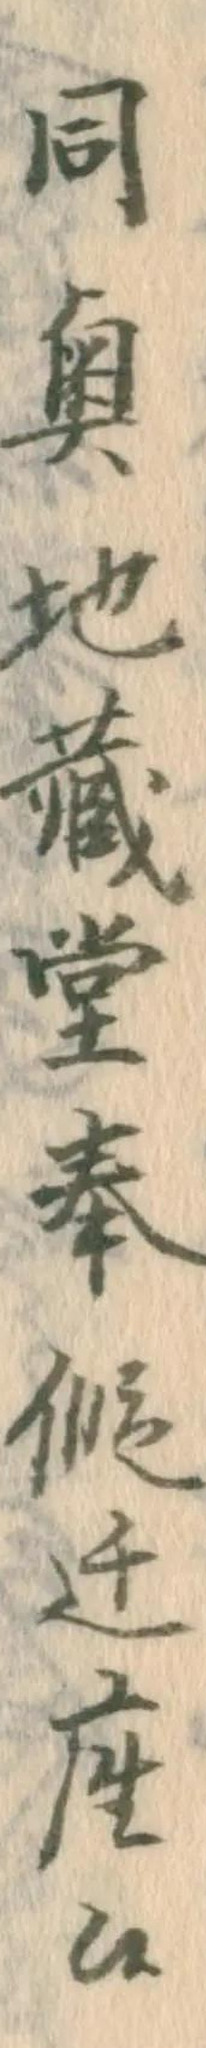同奥地蔵堂奉仮迁座候
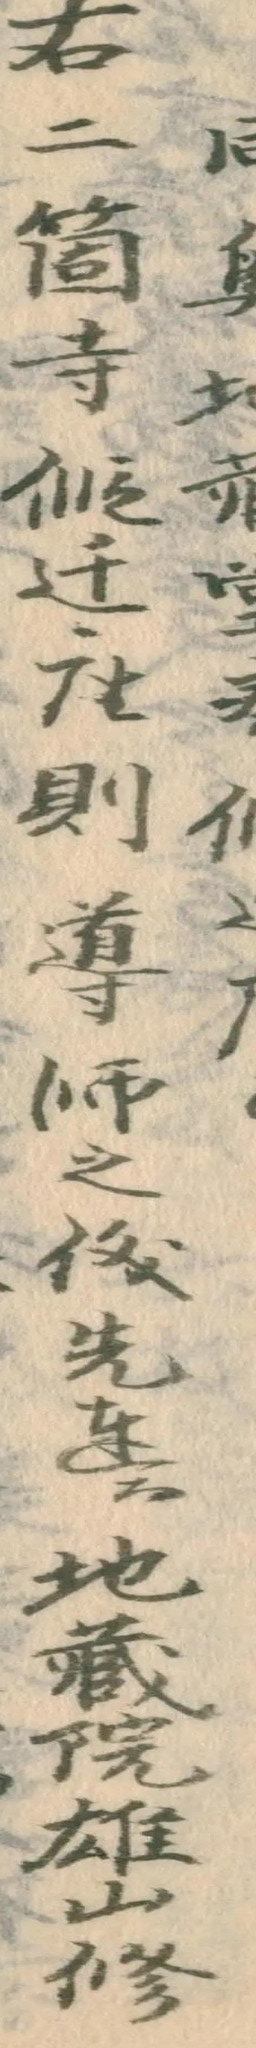右二箇寺仮迁座則導師之儀先達而地蔵院雄山修
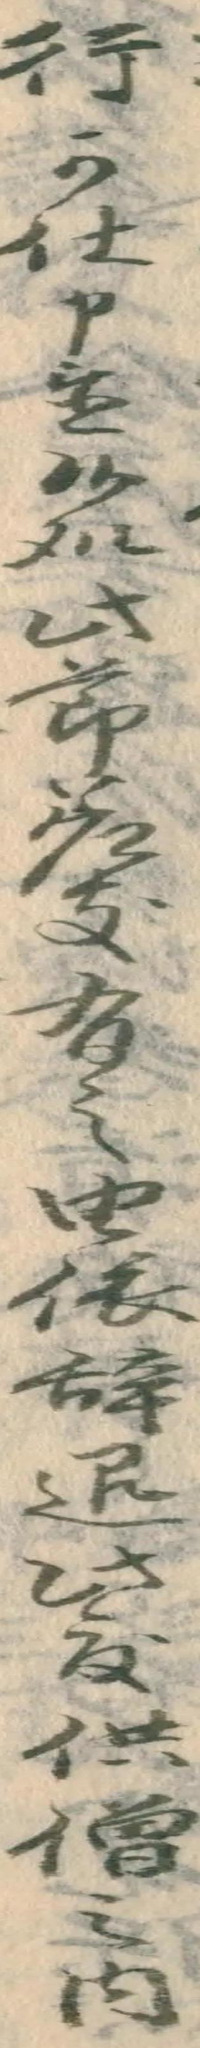行可仕申置候処此節差支有之由依辞退此度供僧之内
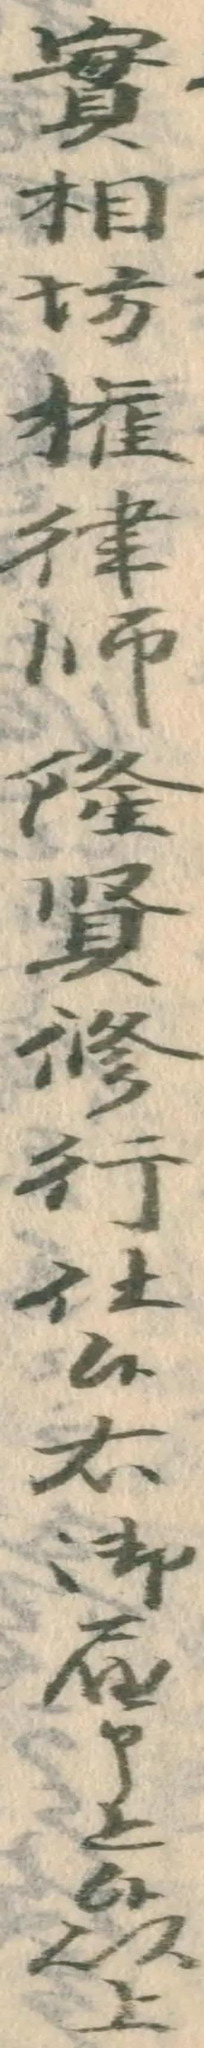実相坊権律師隆賢修行仕候右御届申上候以上
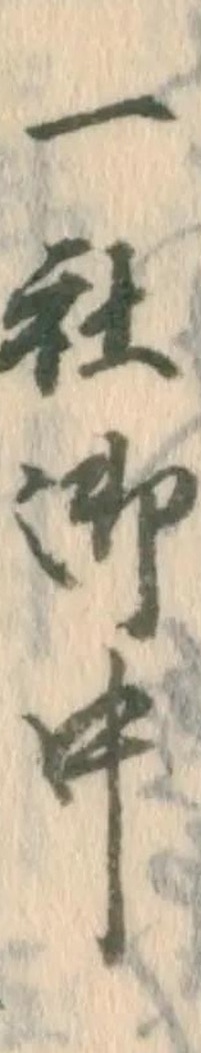一社御中
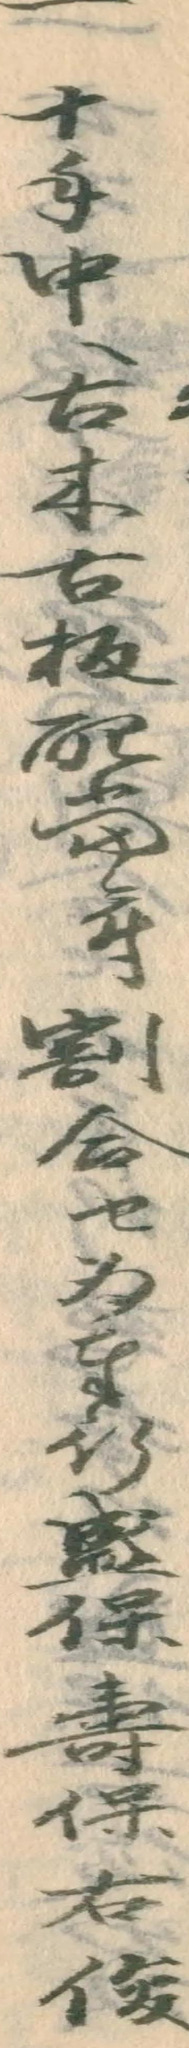一十手中へ古木古板配当ニ付割合セ為奉行盛保寿保右俊
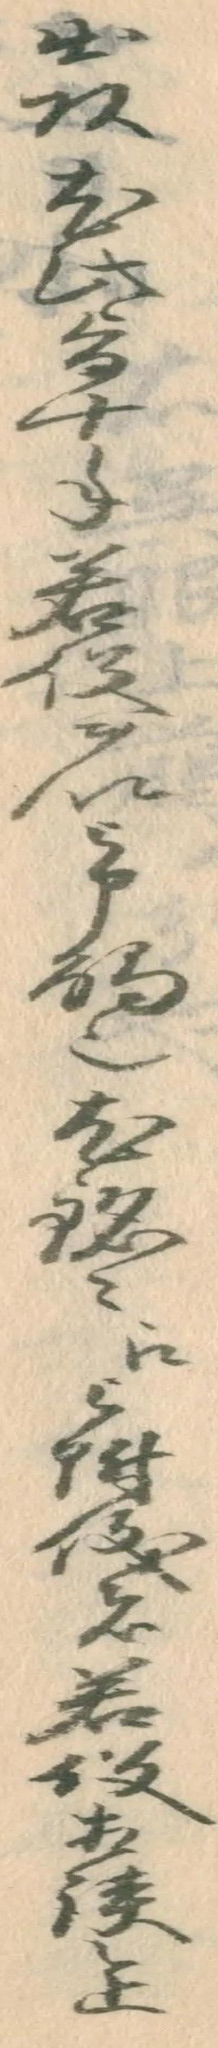出頭尤此旨十手若役ヲ以被申触也尤銘々江被附儀は若役相談之上
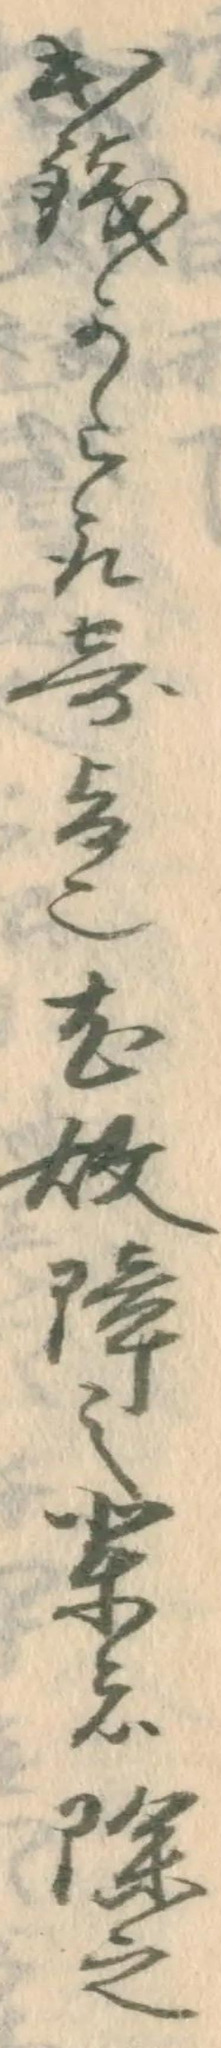出銭可被取寄旨也尤故障之輩は除之
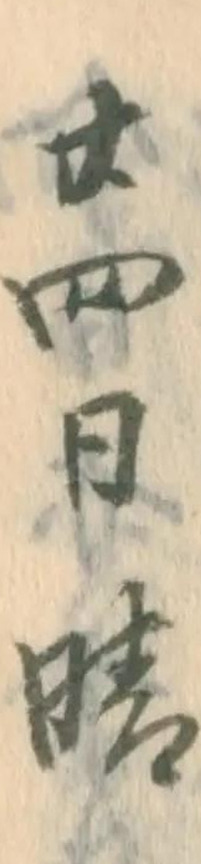廿四日晴

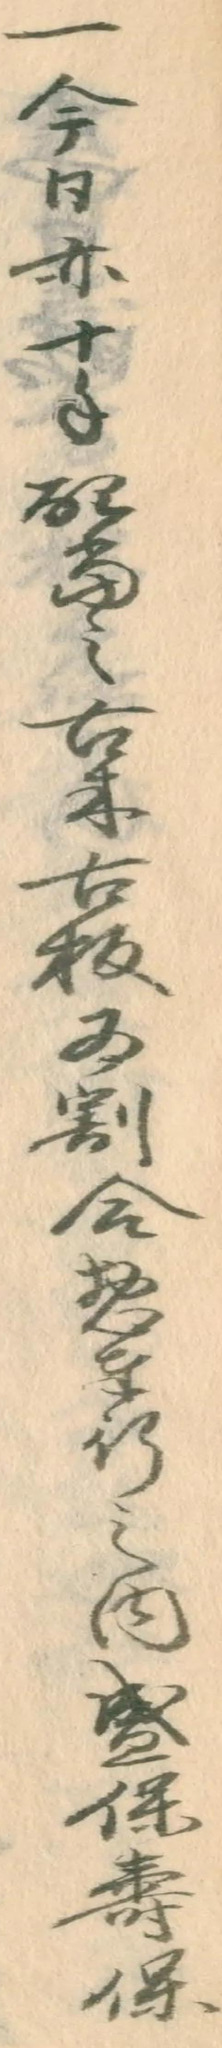一今日亦十手配当之古木古板為割合惣奉行之内盛保寿保
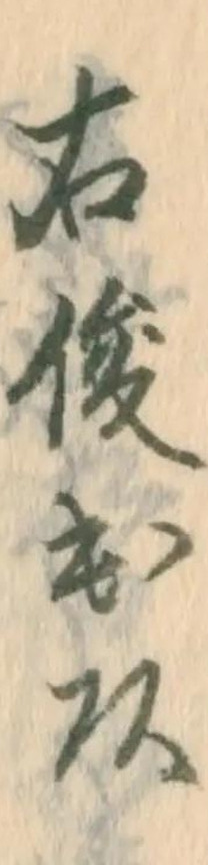右俊出頭
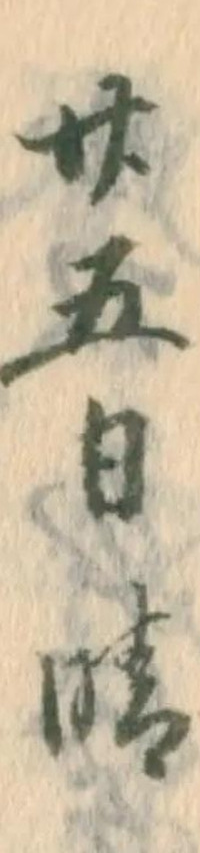廿五日晴
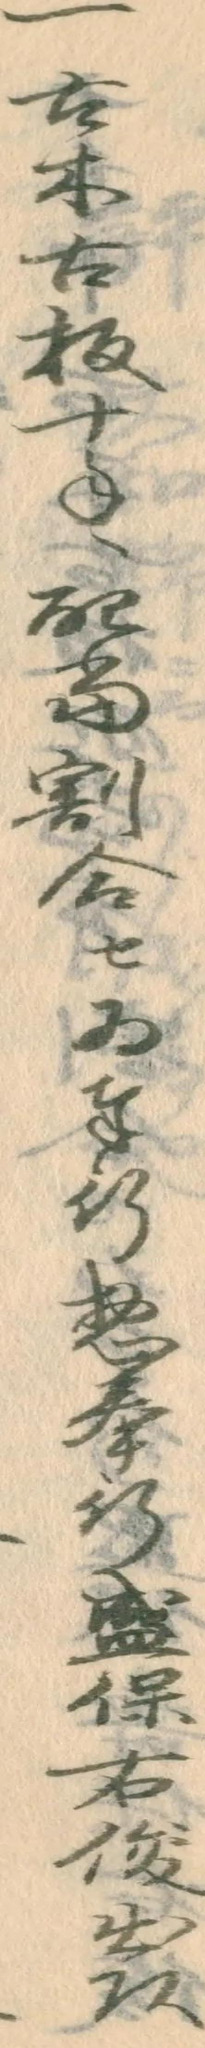一古木古板十手へ配当割合セ為奉行惣奉行盛保右俊出頭
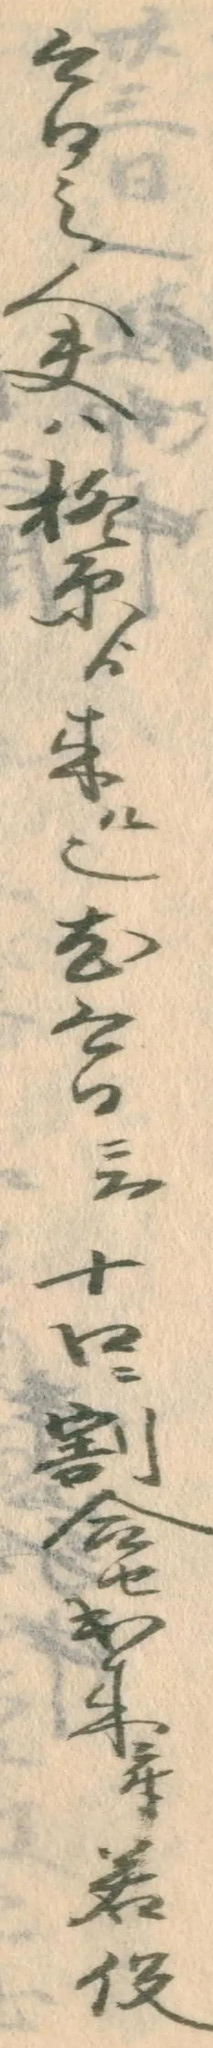今日之人夫ハ柳原ゟ来ル也尤今日ニ而十口ニ割合セ出来ニ付若役
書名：賀茂社記録. 第17冊
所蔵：国立国会図書館 National Diet Library, JAPAN
